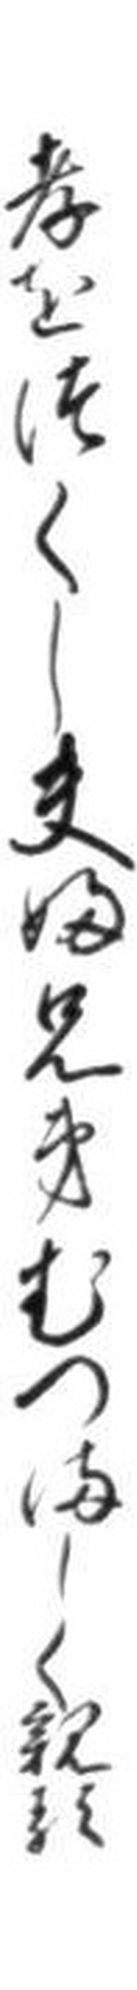孝をつくし夫婦兄弟むつましく親類
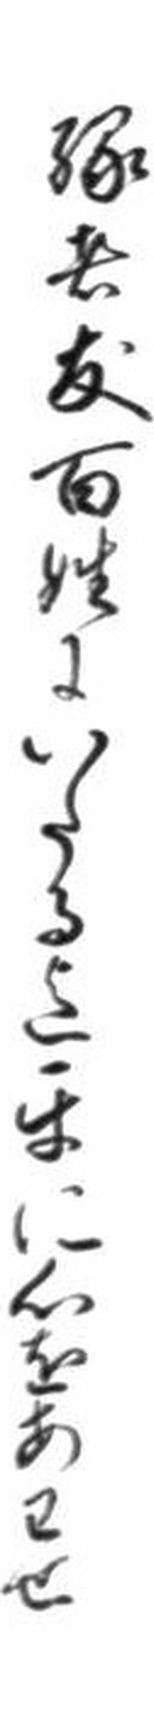縁者友百姓にいたる迄互に心をあわせ
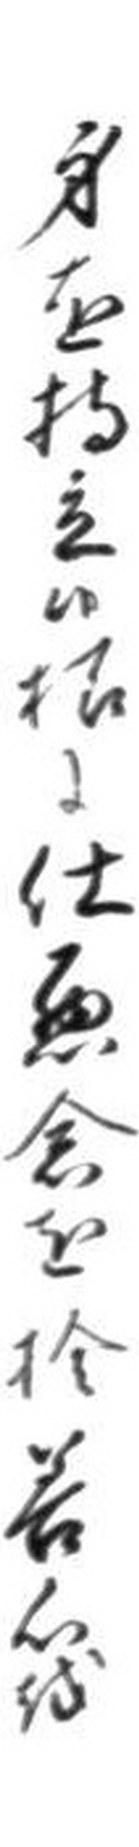身を持立候様に仕悪念を捨善心を
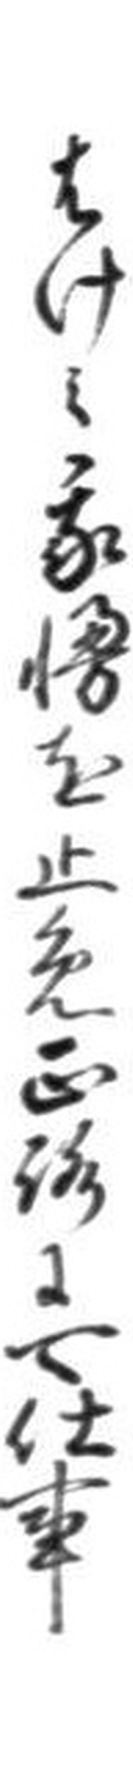はけみ我慢を止め正路に可仕事
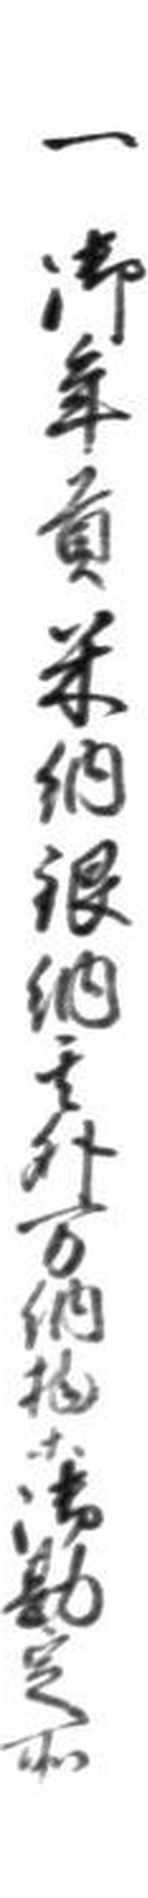一御年貢米納銀納其外万納物等御勘定所
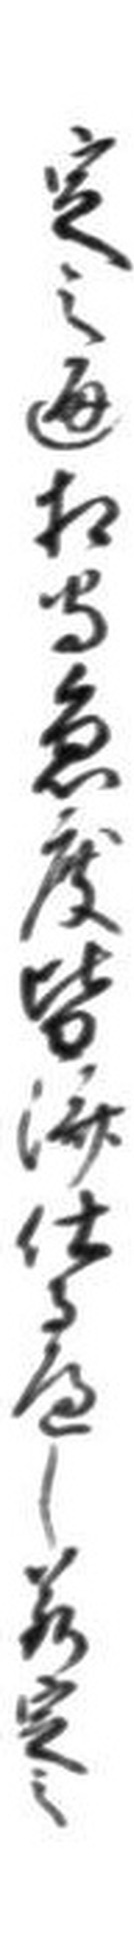定之通相守急度皆済仕るへし若定之
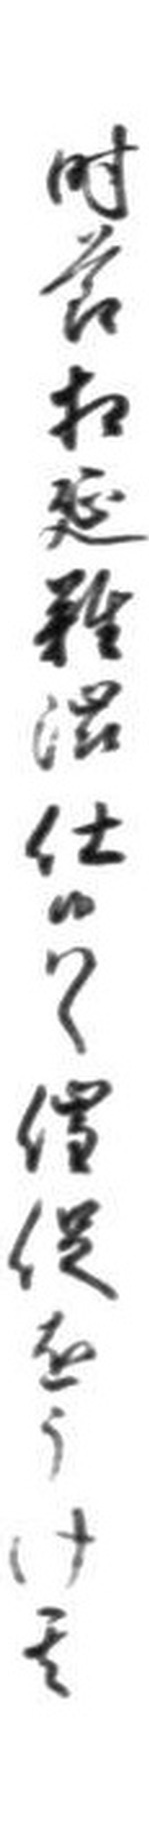時節相延難渋仕候はゝ催促をうけ其
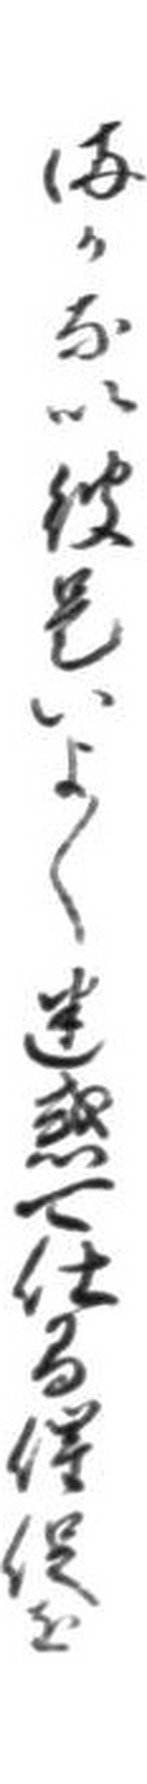まかない彼是いよ〳〵迷惑可仕間催促を
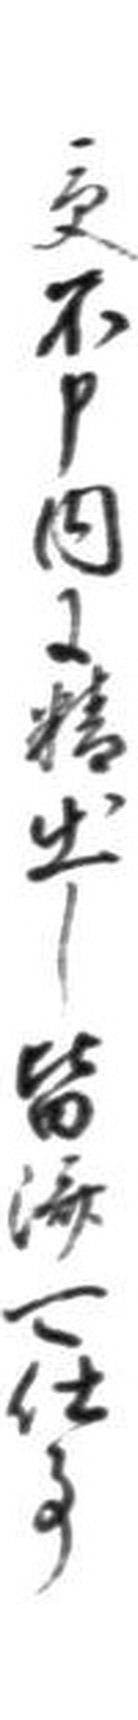受不申内に精出し皆済可仕事
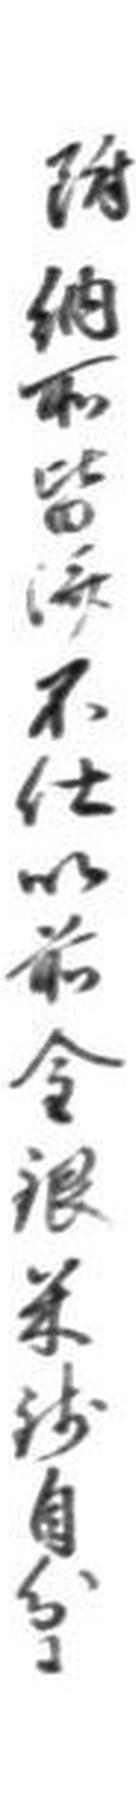附納所皆済不仕以前金銀米銭自分に

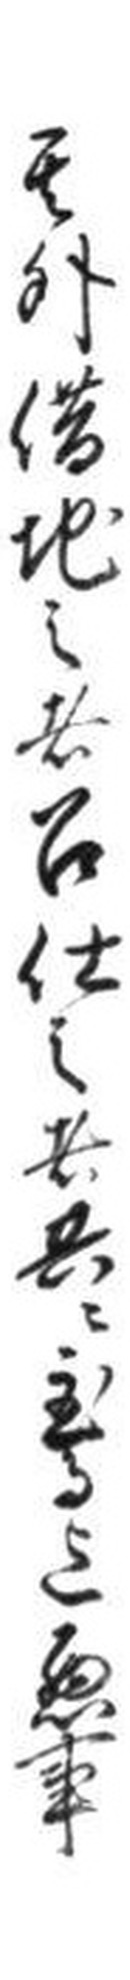其外借地之者召仕之者共に至る悪事
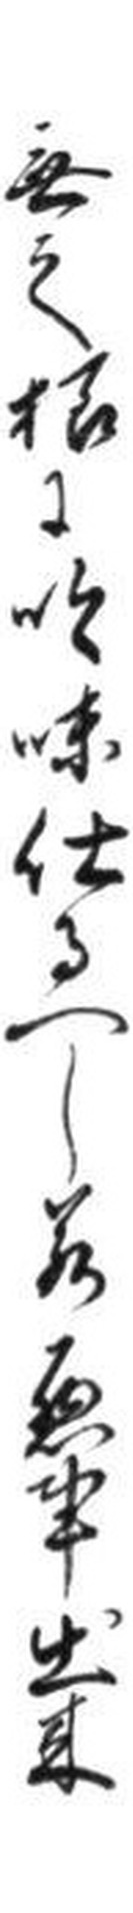無之様に吟味仕るへし若悪事出来
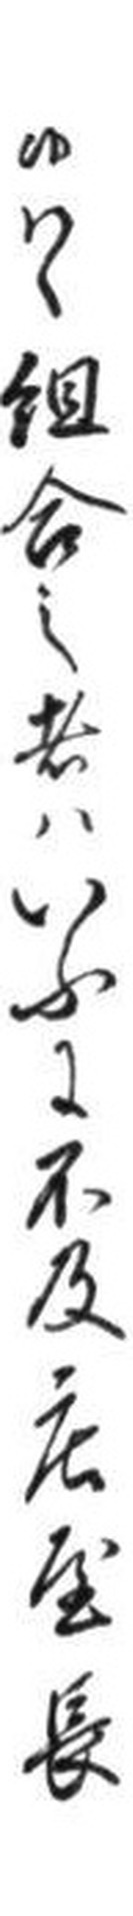候はゝ組合之者はいふに不及庄屋長
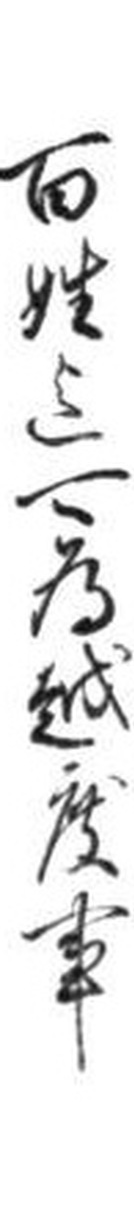百姓迄可為越度事
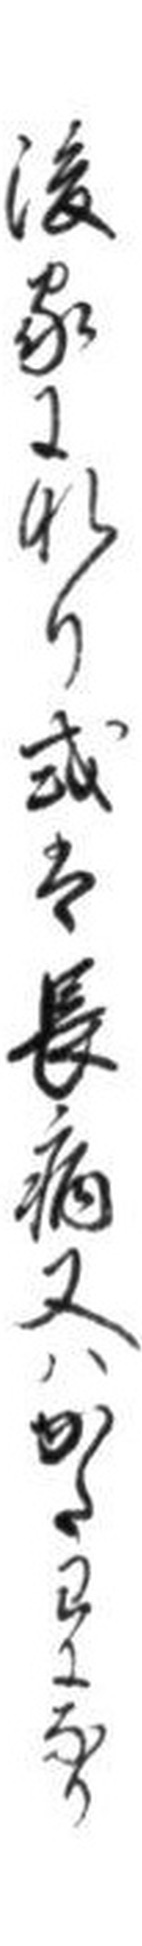後家になり或は長病又はかたわになり
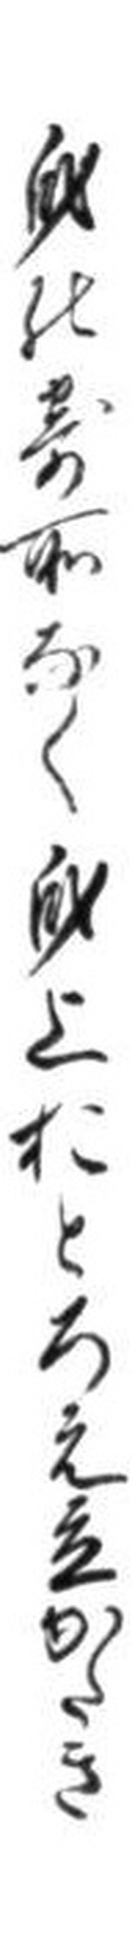身の寄所なく身上おとろえ立かたき
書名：家譜 十六 吉品公 従貞享三年閏三月到同四年
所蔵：福井県文書館 Fukui Prefectural Archives
